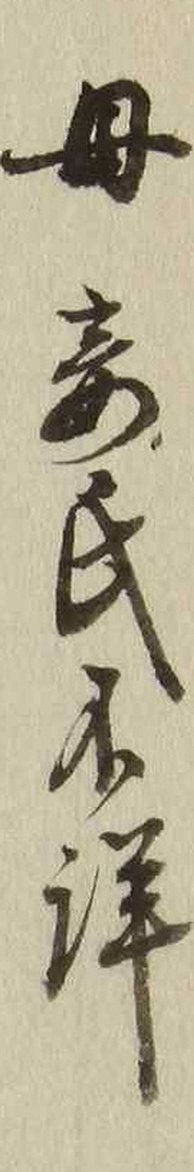母妾氏不詳
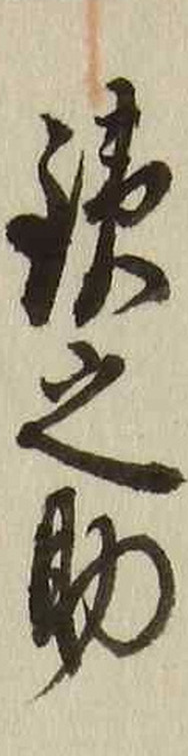鉄之助
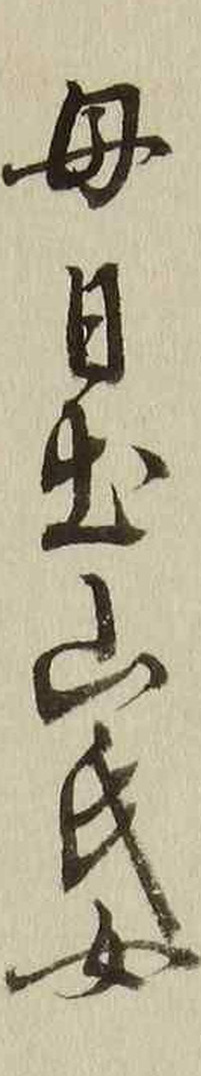母日出山氏女
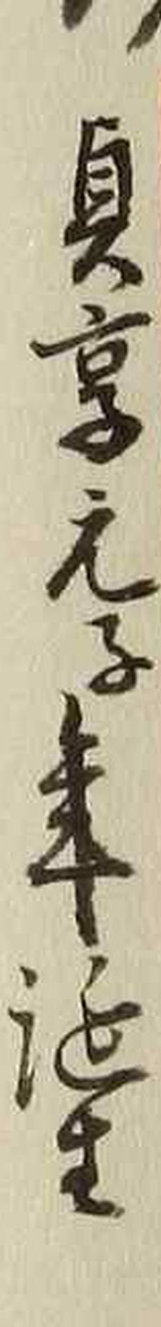貞享元子年誕生
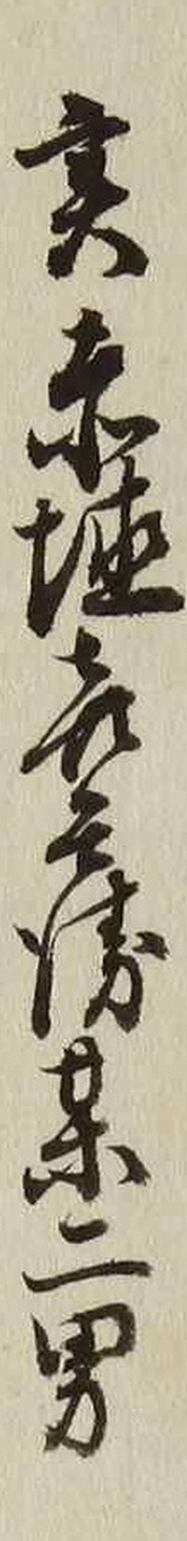実赤埴喜兵衛某二男
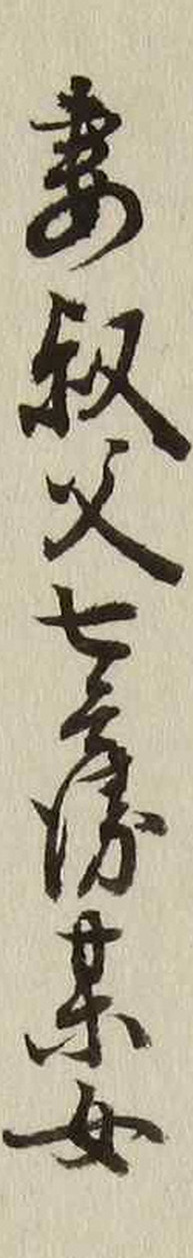妻叔父七兵衛某女
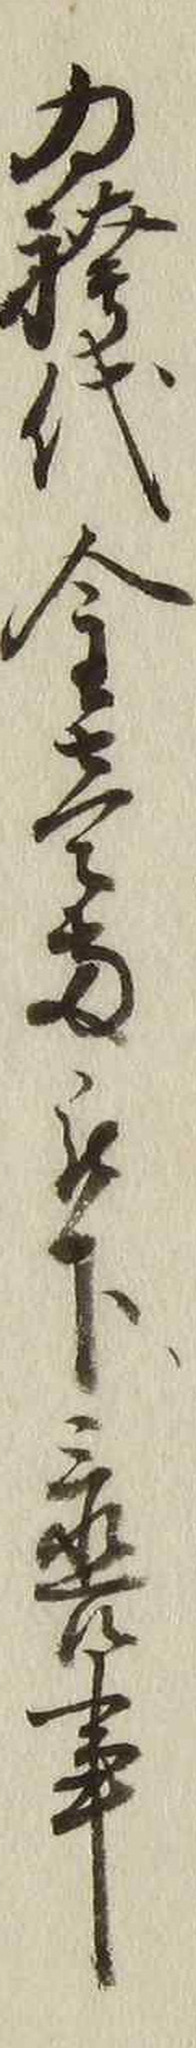為袴代金壱両被下置候事
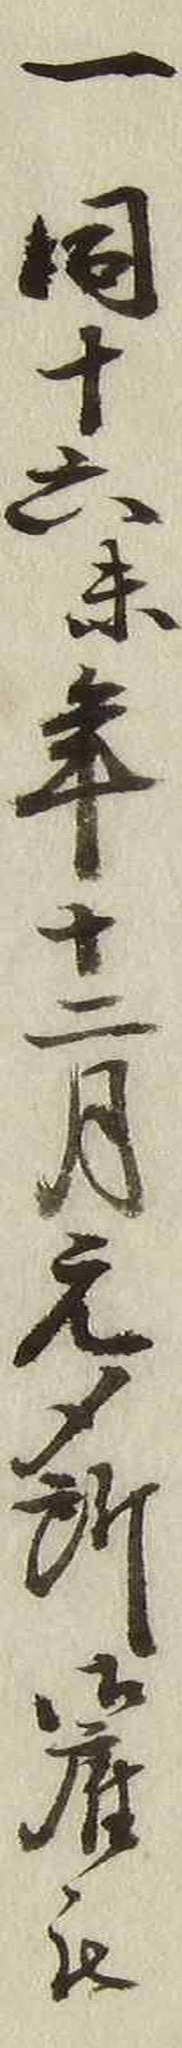一同十六未年十二月元〆所御雇被
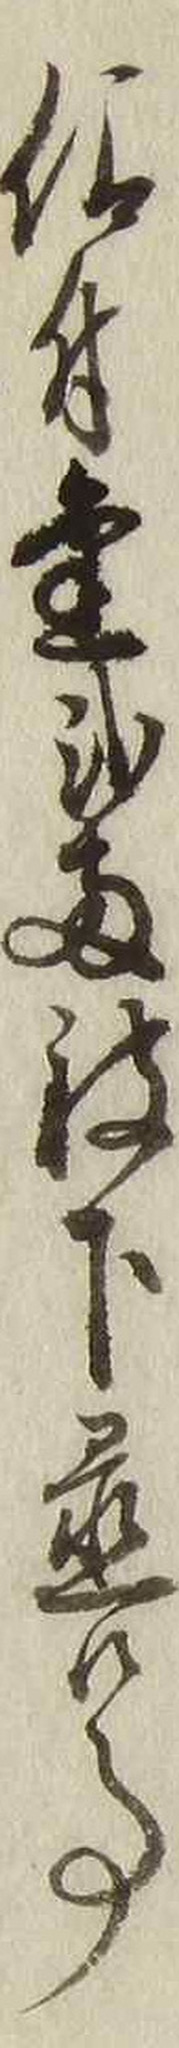仰付金弐両被下置候事
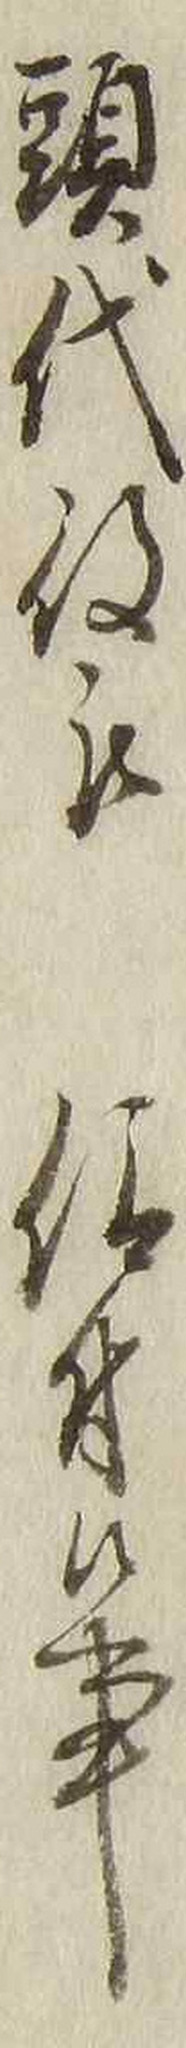頭代役被仰付候事
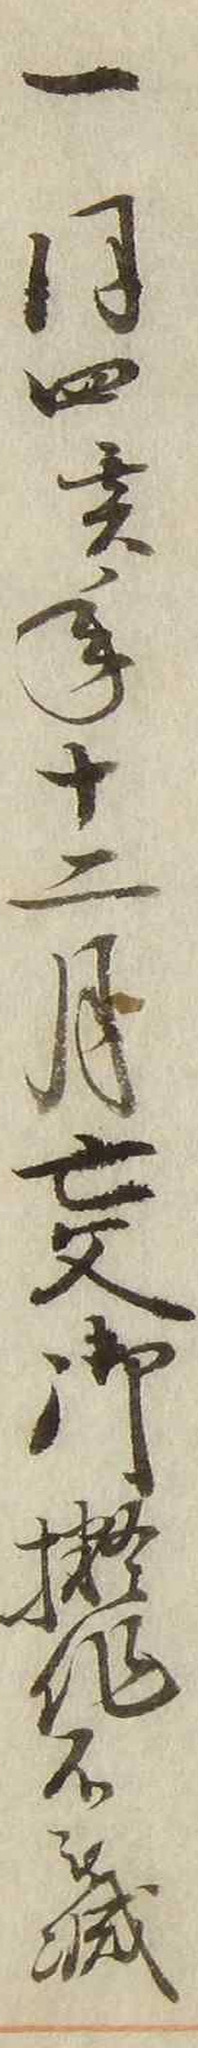一同四亥年十二月亡文御擬作不被減

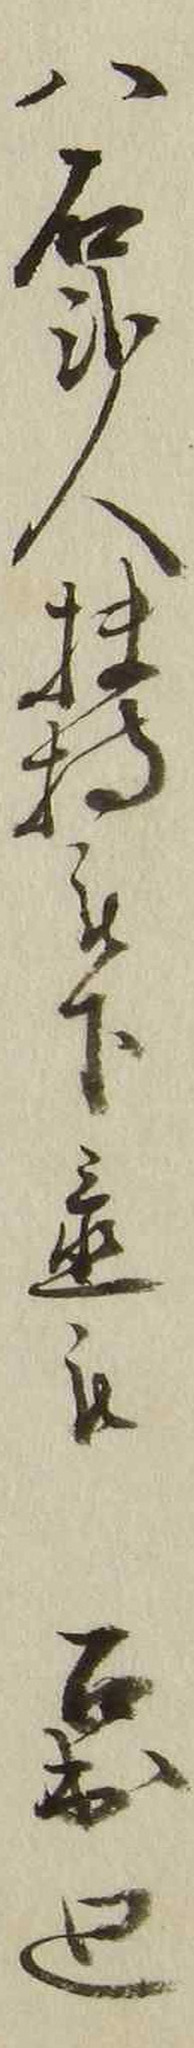八石弐人扶持被下置被召出廻
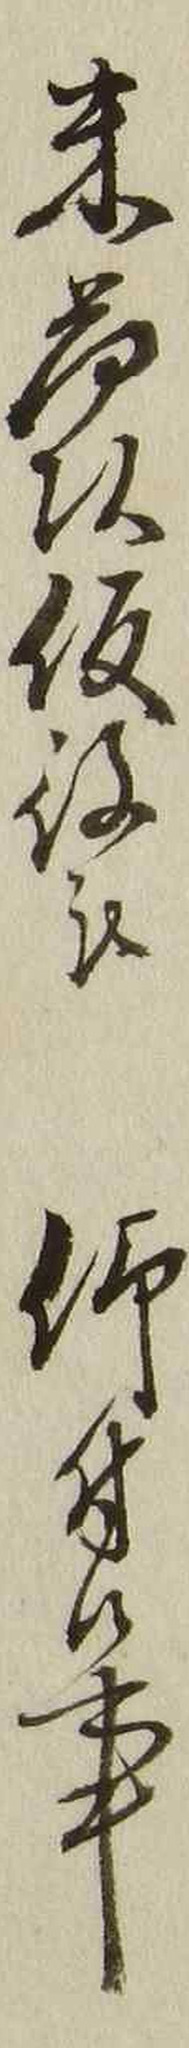米荷頭仮役被仰付候事
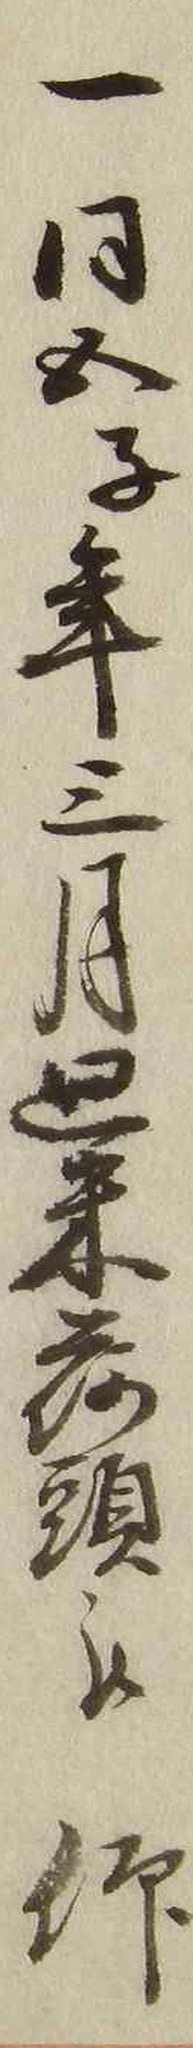一同五子年三月廻米荷頭被仰
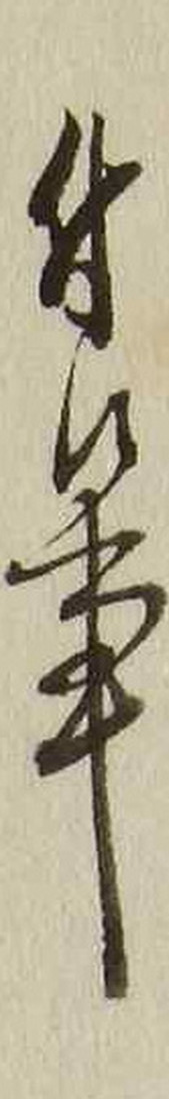付候事
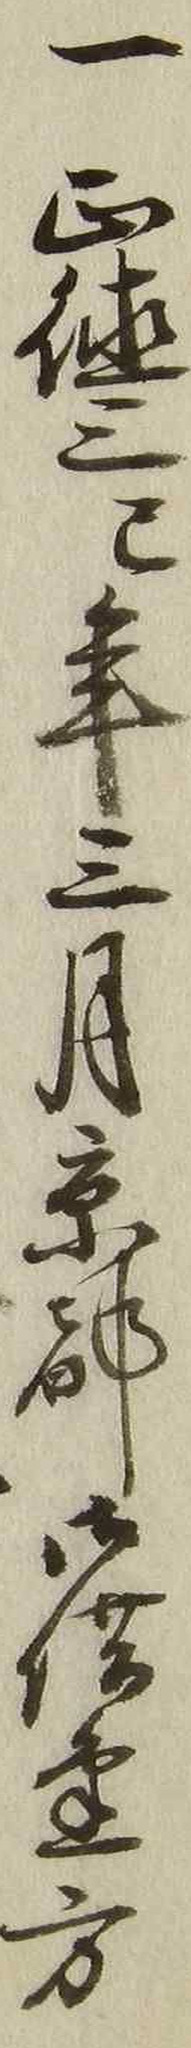一正徳三巳年三月京都御借金方
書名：諸士系譜　巻之27　い之部27
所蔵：会津若松市立会津図書館
